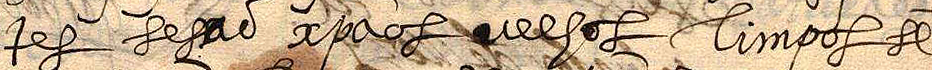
tes se saõ xpãos uelhos limpos sē
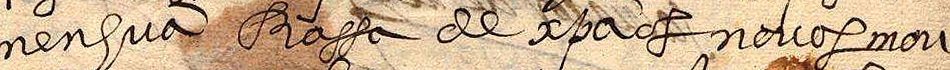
nenhuā Rassa de xpãos nouos mou
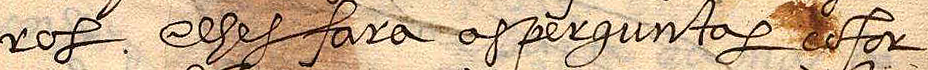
ros. e lhes fara as perguntas cōfor
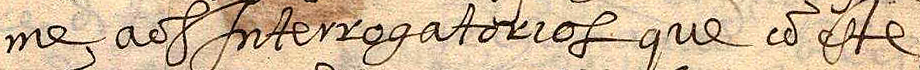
me aos Jnterrogatorios que cō este
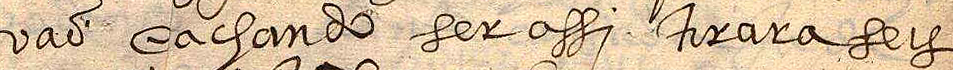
vaõ e achando ser assj tirara seis
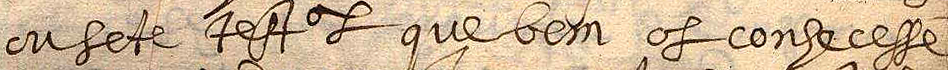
ou sete testas que bem os conhecessē
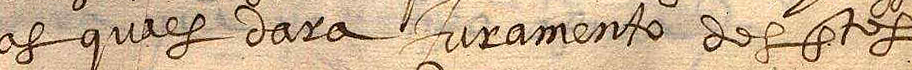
as quaes dara Juramento dos stos
